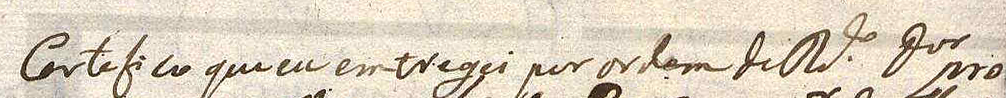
Certefico que eu emtregei por ordem de Rd.o D.or pro
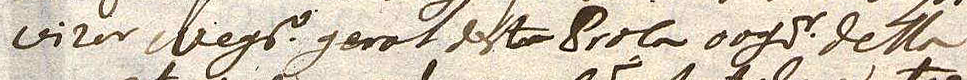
vizor e Vigr.o geral desta Praça ao Gv.r della
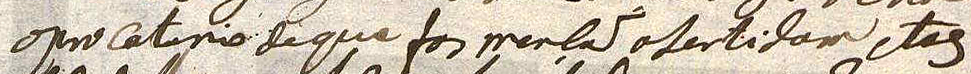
o precatorio de que fas mençaõ a sertidam e tas
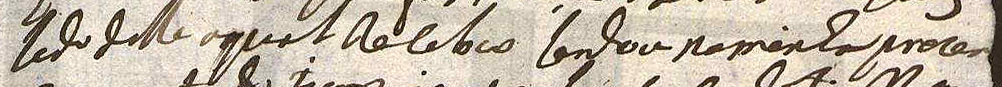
lado delle o qual Recebeo lendoce na minha prezem
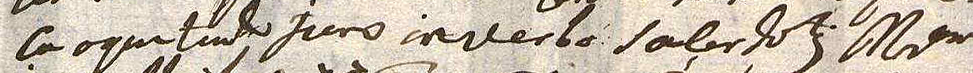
ça o que tudo juro in verbo saCerdotis Mram
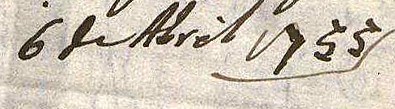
6 de Abril 1755
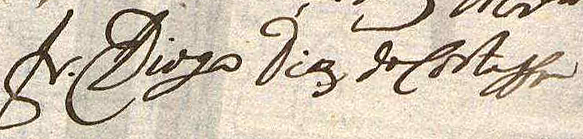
fr. Diogo Diaz da Costa
